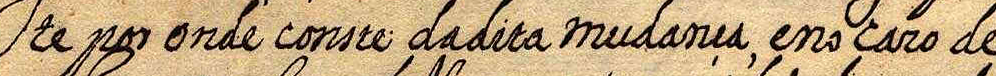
te por onde conste da dita mudança, e no cazo de
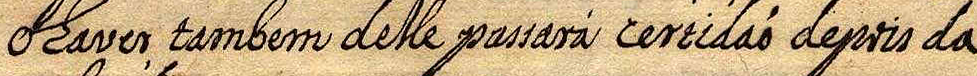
o haver, tambem delle passará certidaõ depois da
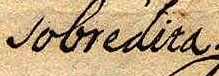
sobredita.
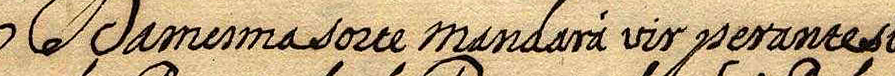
Da mesma sorte mandará vir perante si
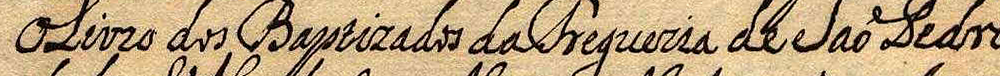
o Livro dos Baptizados na Freguezia de Saõ Pedro
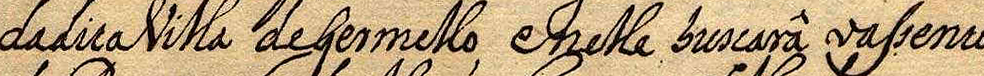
da dita Villa de Germello, e nelle buscará o assento
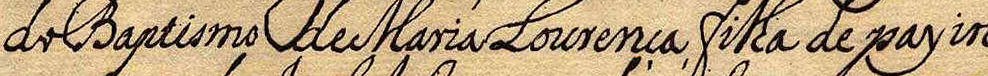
do Baptismo de Maria Lourença, filha de pay in
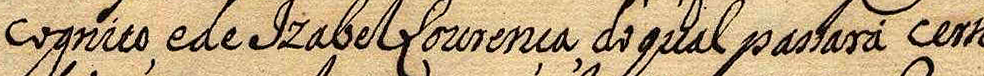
cognito, e de Izabel Lourença, do qual passará certi
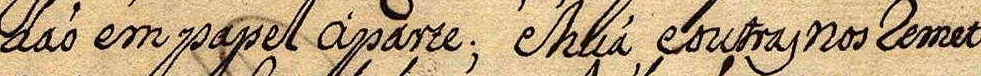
daõ em papel á parte; e huā, e outras nos Remet
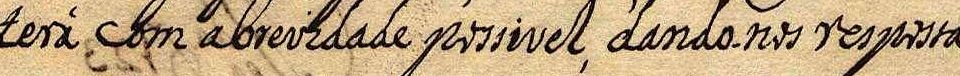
terá com a brevidade possivel, dando-nos resposta
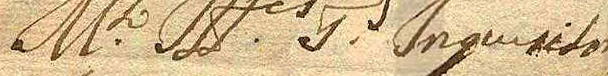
M.to Ill.es S.s Inquisidores
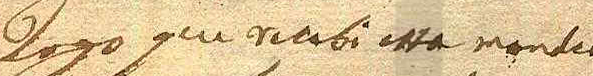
Logo que recebi esta mandei
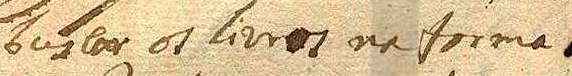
buscar os livros na forma
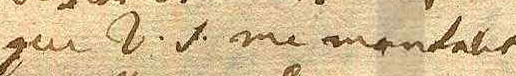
que V. s. me mandaua,
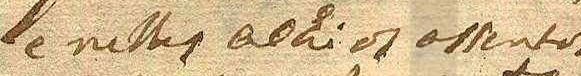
e nelles achei os assentos
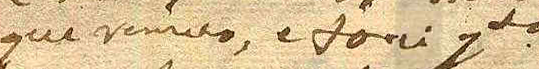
que remeto, e farei q.to
